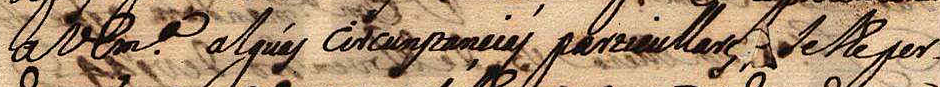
a V Em.a alguās circunstancias particullares, se lhe per
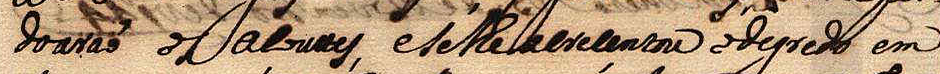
doaraõ os açouttes, e se lhe acrecentou o degredo em
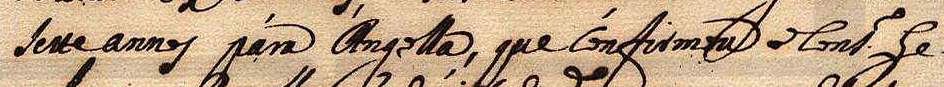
sette annos para Angolla, que confirmou o Cons.o Ge
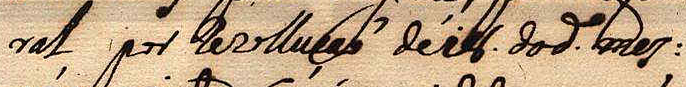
ral, por Rezolluçaõ de 18. do d.o mes:
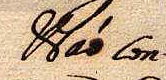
Naõ Con
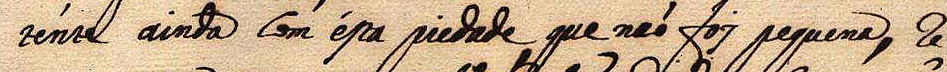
tente ainda com esta piedade que naõ foj pequena, Re
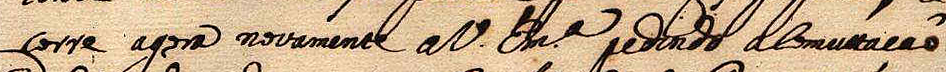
corre agora novamente a V. Em.a pedindo a Comuttaçaõ
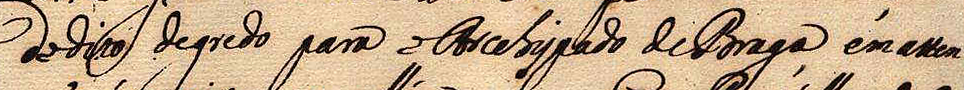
do dito degredo para o Arcebispado de Braga, em atten
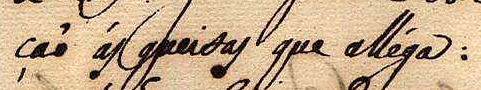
çaõ ás queixas que allega:
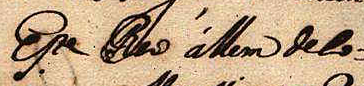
Este Reo allem de co
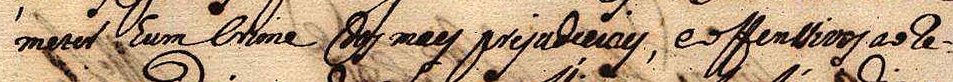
meter hum Crime dos maes prejudeciaes, e offenssivos ao Re
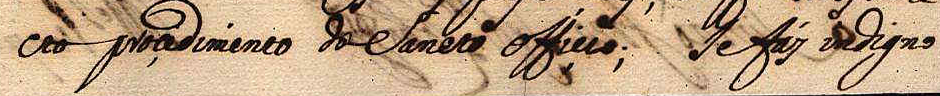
cto procedimento do Sancto officio; se fas indigno
